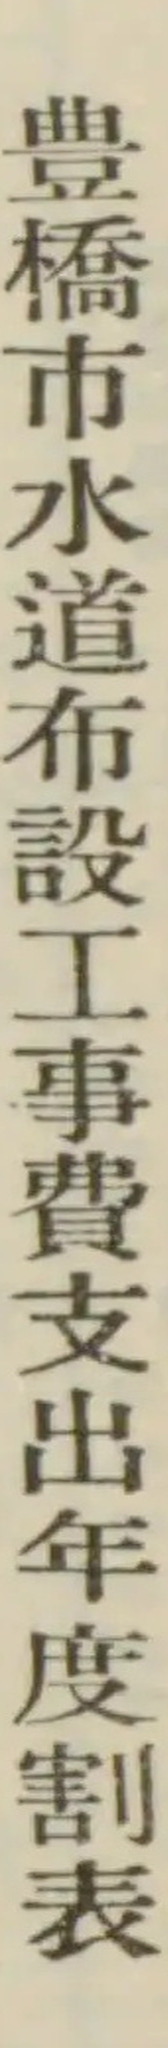豊橋市水道布設工事費支出年度割表

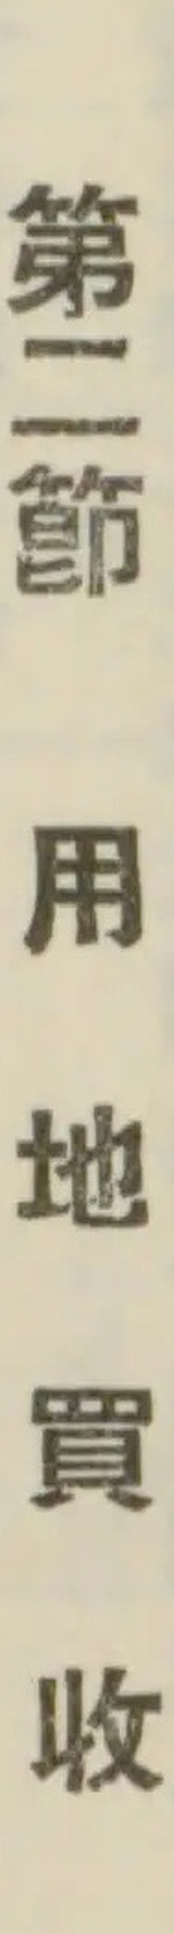第二節用地買収
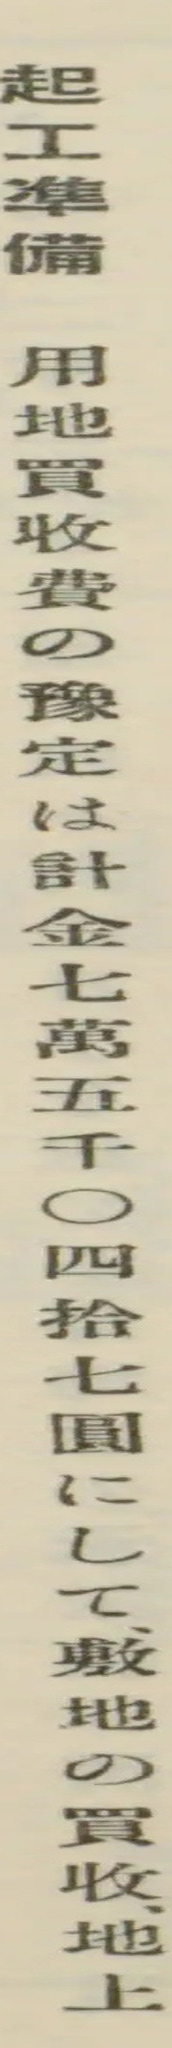起工準備用地買収費の予定は計金七萬五千〇四拾七圓にして、敷地の買収、地上
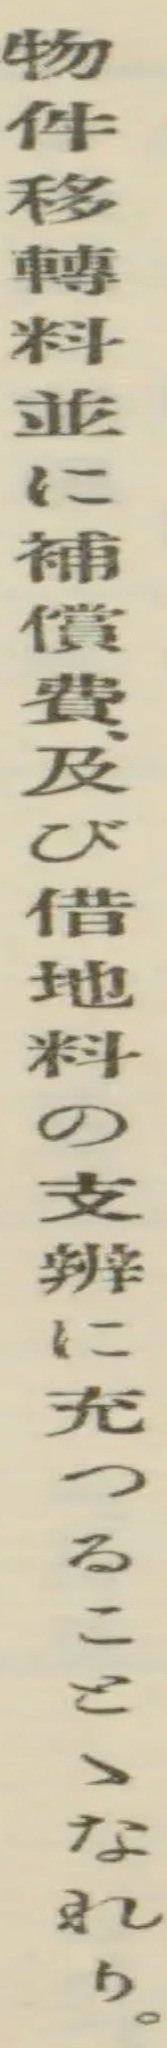物件移轉料並に補償費、及び借地料の支辨に充つることゝなれり。
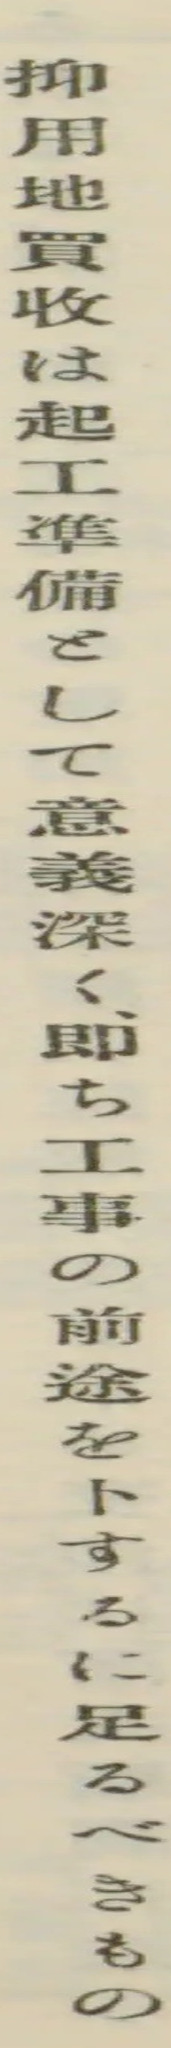抑用地買収は起工準備として意義深く、即ち工事の前途を卜するに足るべきもの
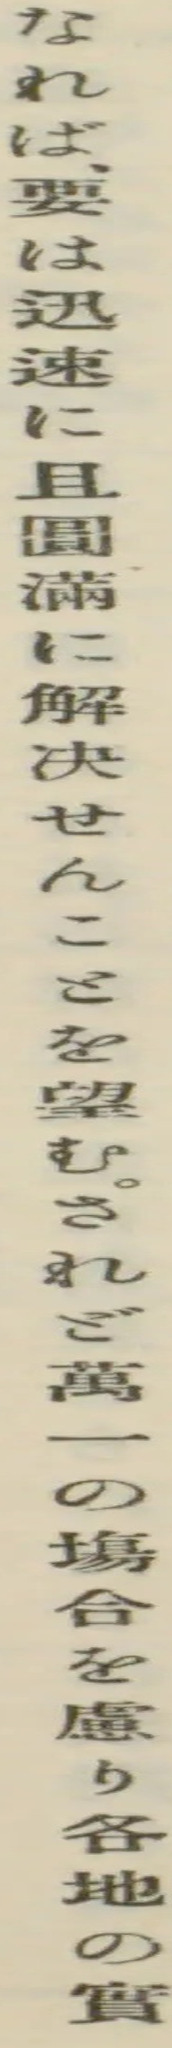なれば、要は迅速に且円満に解決せんことを望む。されど萬一の場合を慮り各地の実
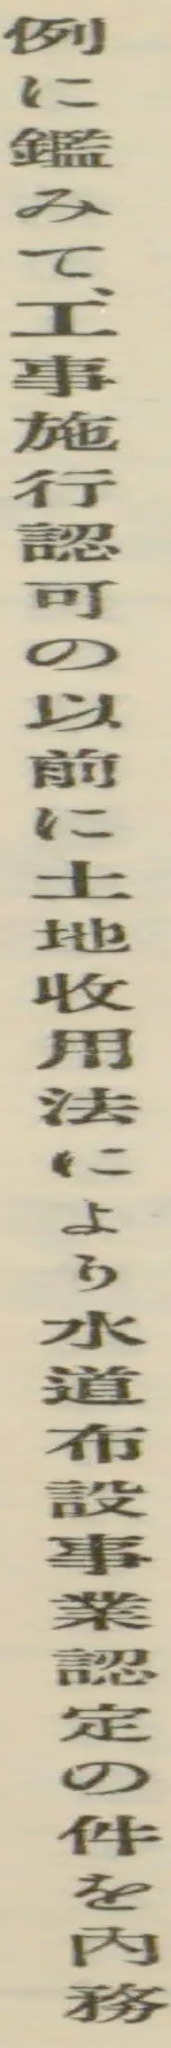例に鑑みて、工事施工認可の以前に土地収用法により水道布設事業認定の件を内務
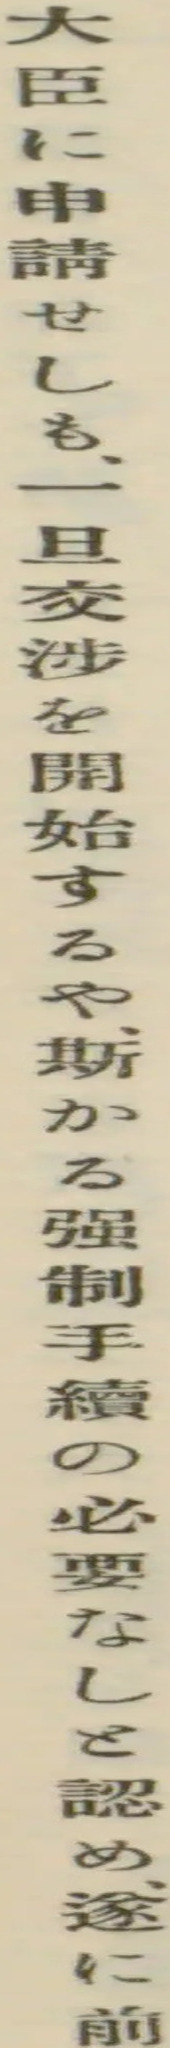大臣に申請せしも、一旦交渉を開始するや、斯かる強制手続の必要なしと認め、遂に前

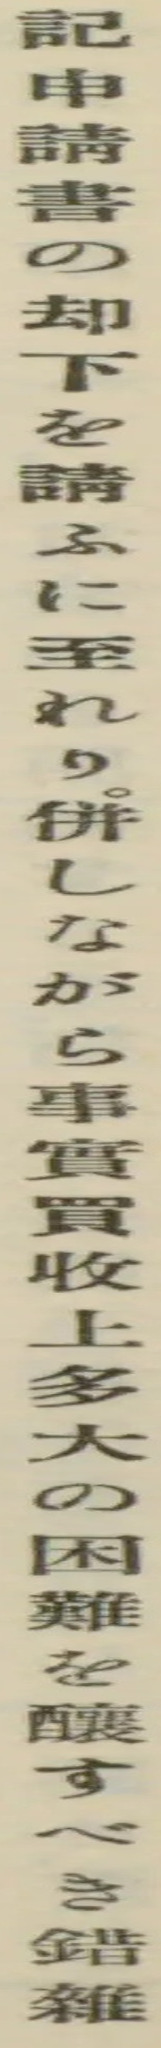記申請書の却下を請ふにいた至れり。併しながら事実買収上多大の困難を醸すべく錯雑
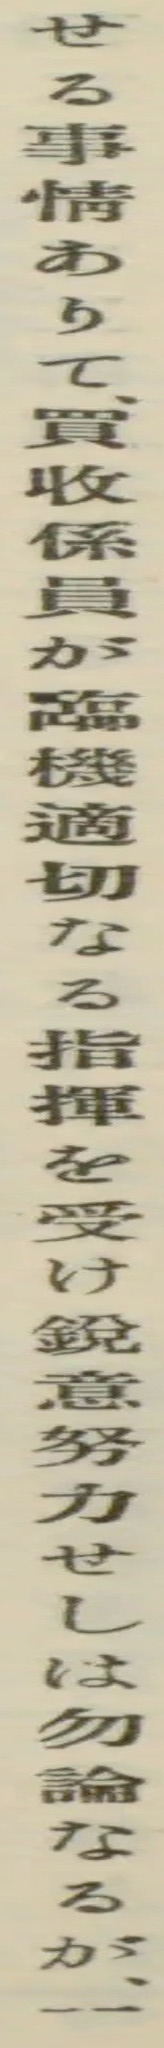せる事情ありて、買収係員が臨機適切なる指揮を受け鋭意努力せしは勿論なるが、一
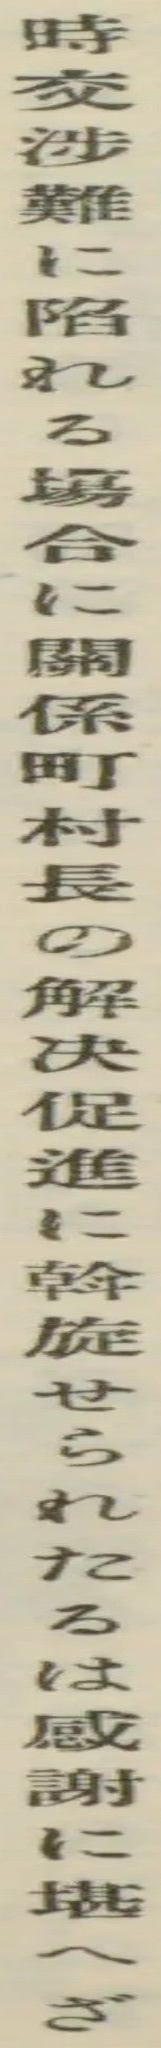時交渉難に陥れる場合に関係町村長の解決そ促進に斡旋せられたるは感謝に堪へざ
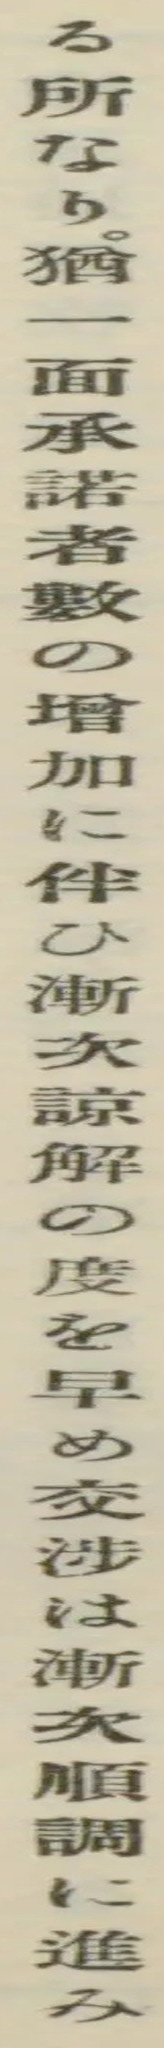る所なり。猶一面承諾者数の増加に伴ひ暫漸次諒解の度を早め交渉は漸次順調に進み
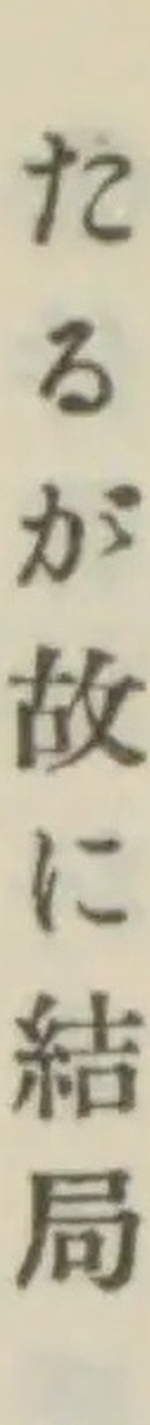たるが故に結局
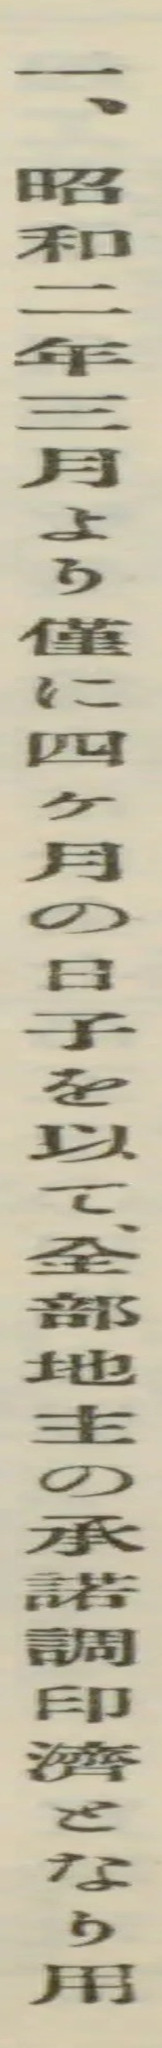一、昭和二年三月より僅に四か月の火日子を以て、全部地主の承諾調印済となり用
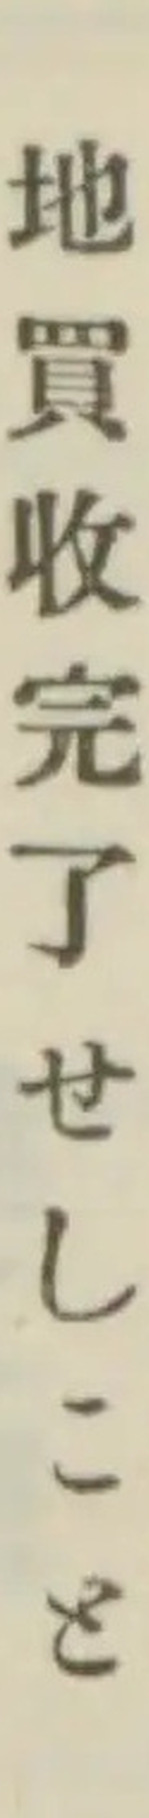地買収完了せしこと
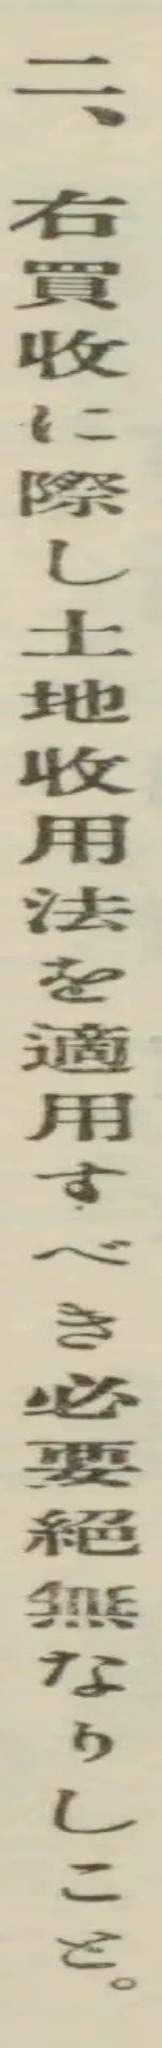二、右買収に際し土地収用法を適用すべき必要絶な無なりしこと。
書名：豊橋市水道誌
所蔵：国立国会図書館 National Diet Library, JAPAN
